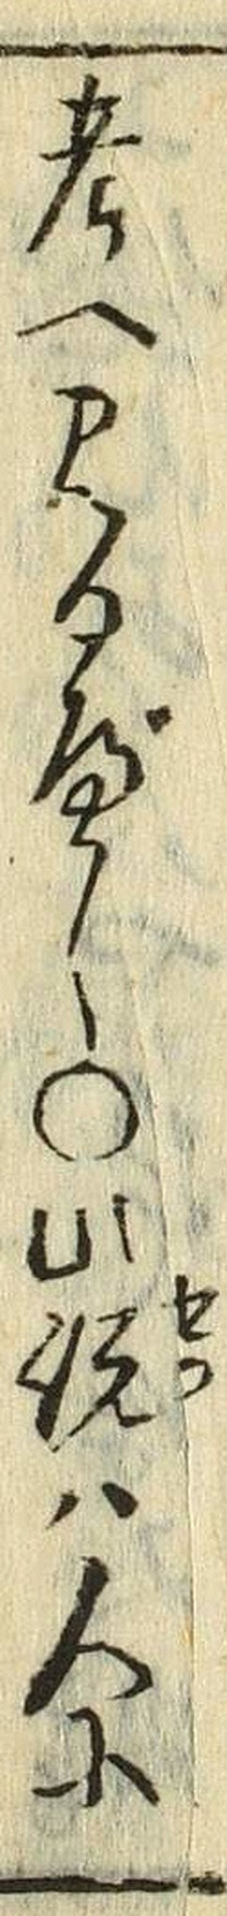考へ見るべし○此説は人に
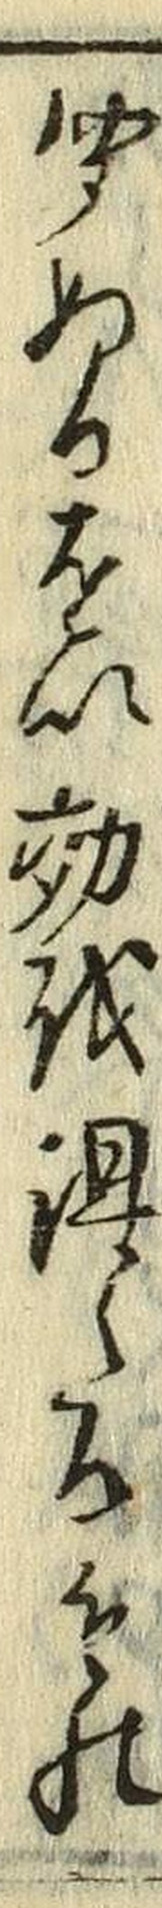聞ぬるを以効を得たるもの
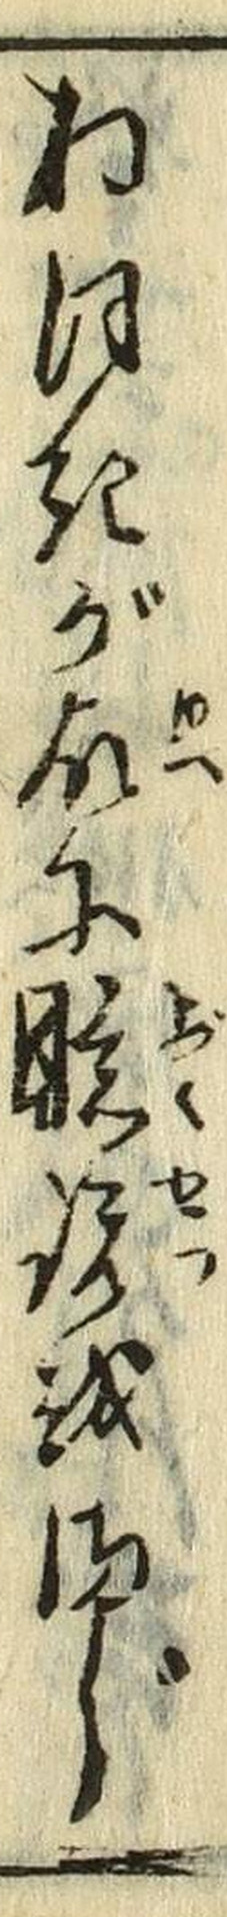おほきが故に臆説をまじ
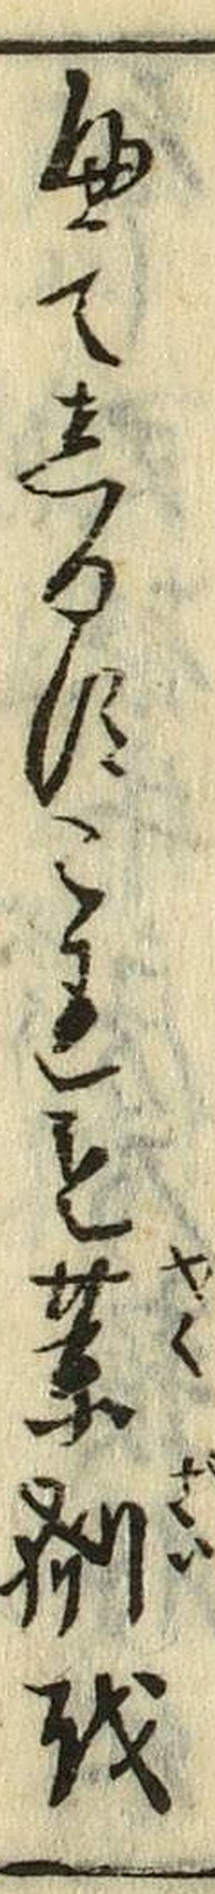へてしるすこれも薬剤を
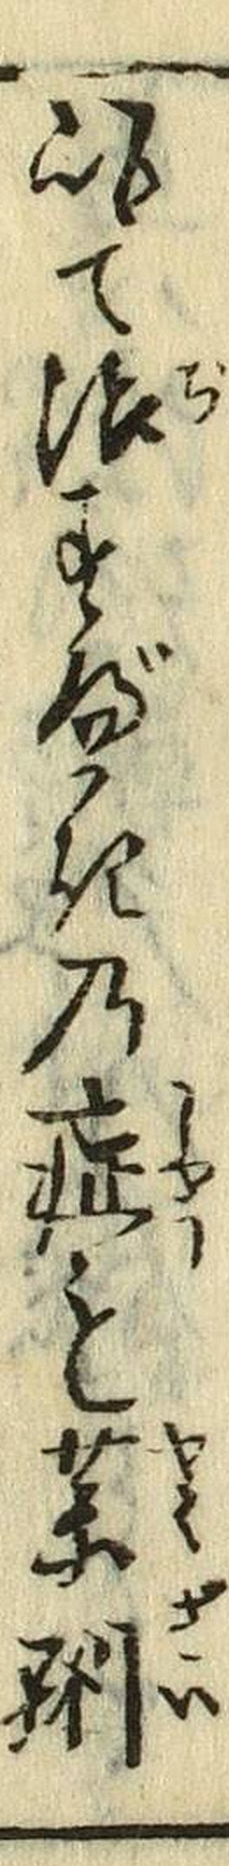以て治すべきの症も薬剤
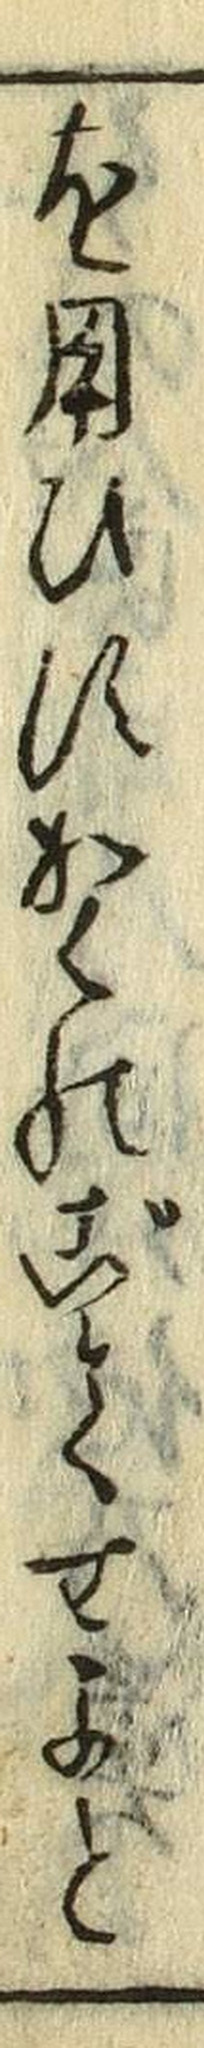を用ひすかくのごとくせよと
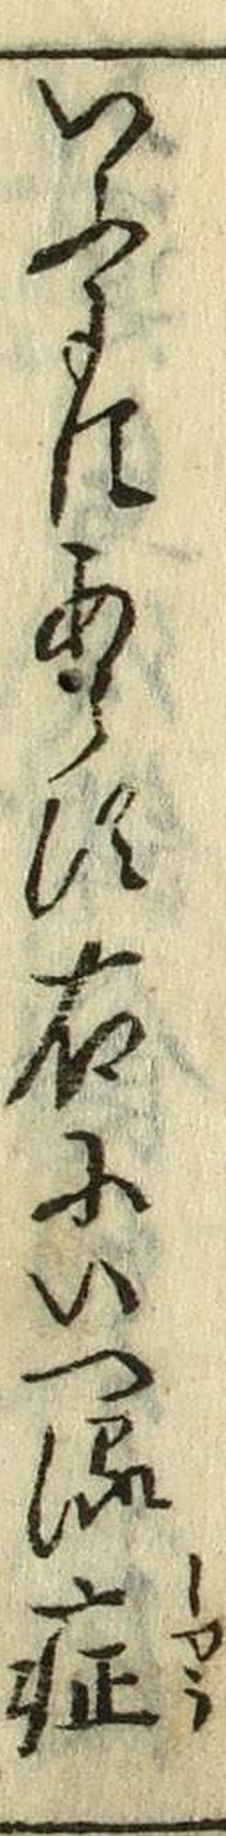いふにはあらす右にいへる症
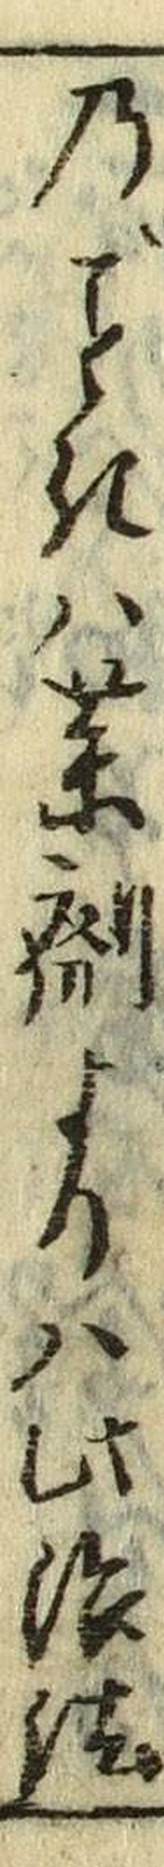のごときは薬剤よりは此治法
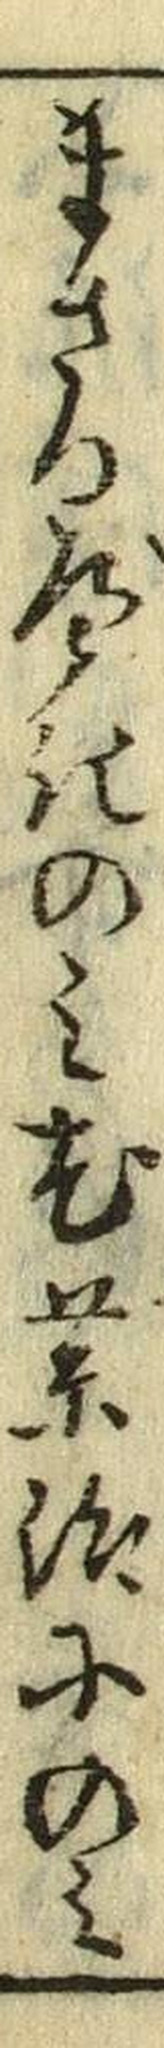まさるべきのみ尤薬治にのみ

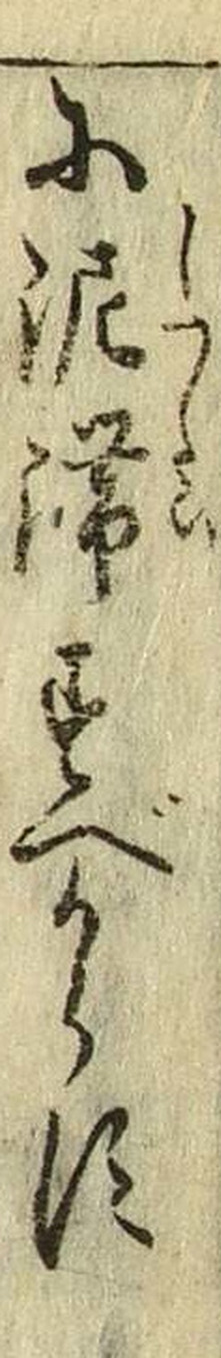に泥滞すべからす
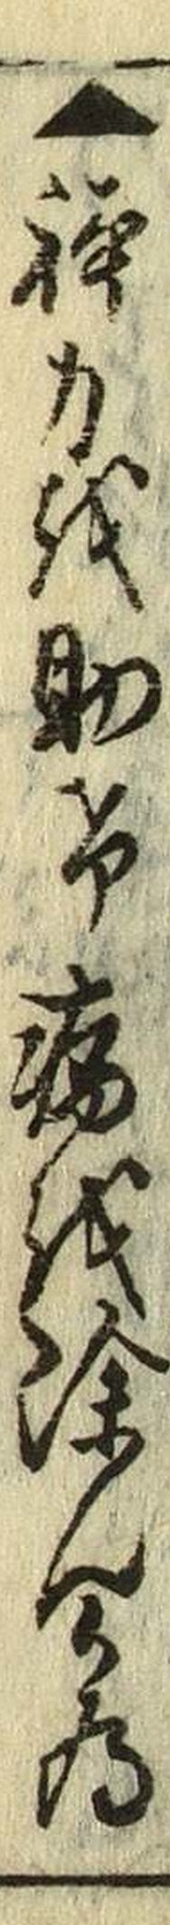▲体力を助け病を除んか為
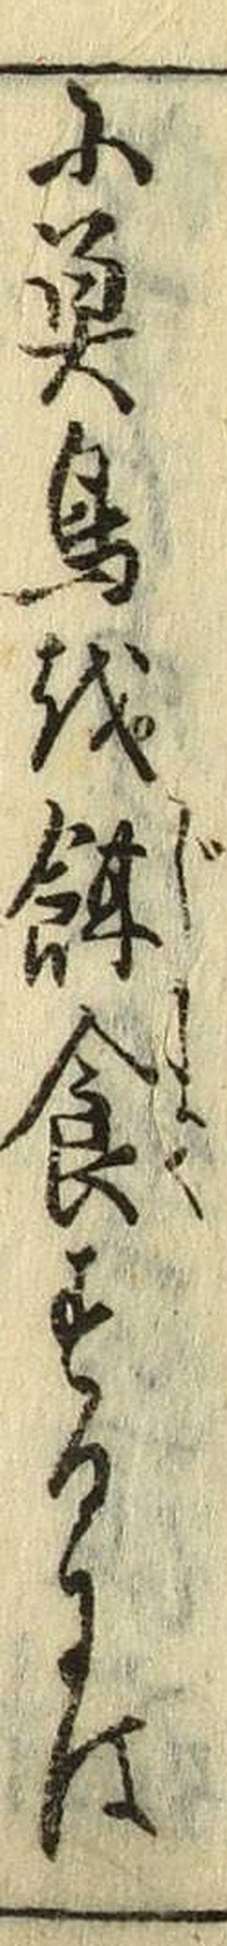に魚鳥を餌食するには
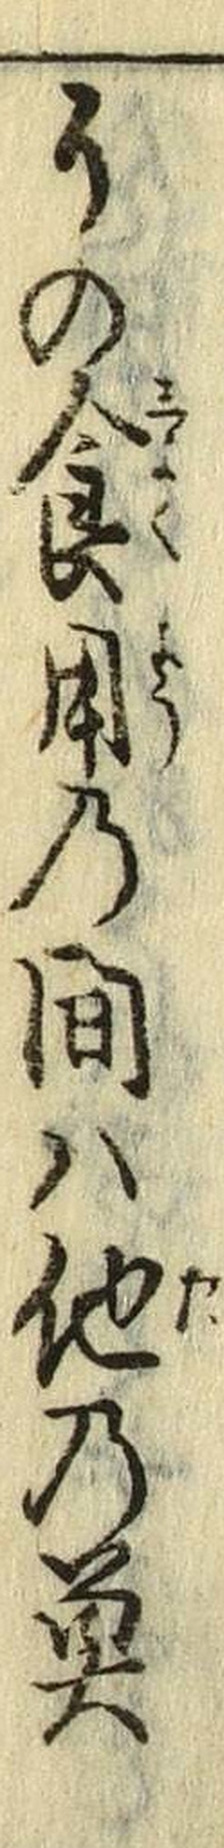その食用の間は他の魚
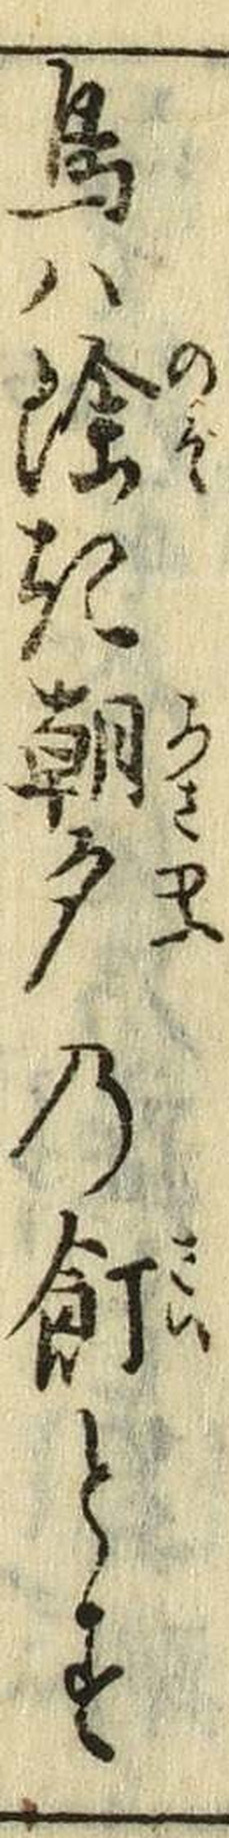鳥は除き朝夕の飣とす
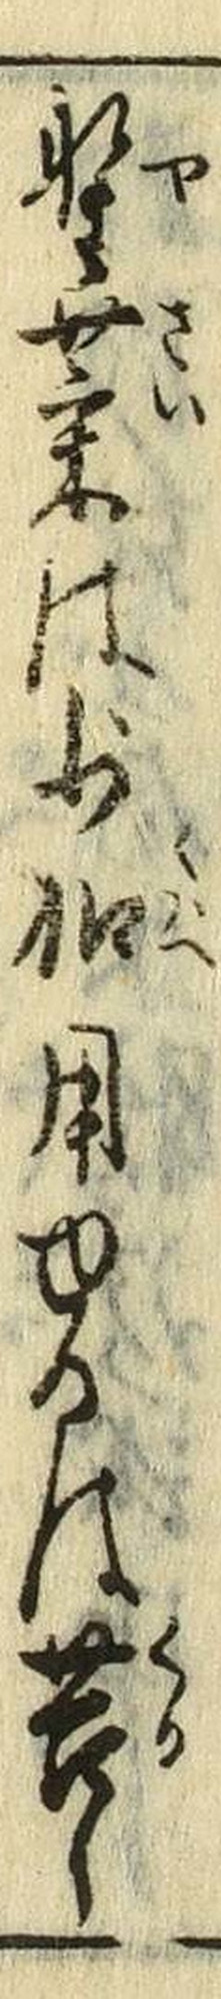野菜は少加用ゆるは苦し
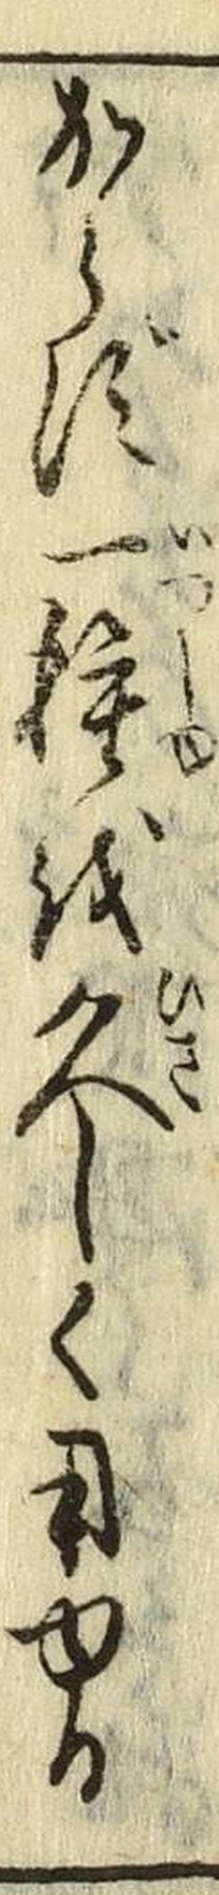からず一種を久しく用ゆる
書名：居家養生記
